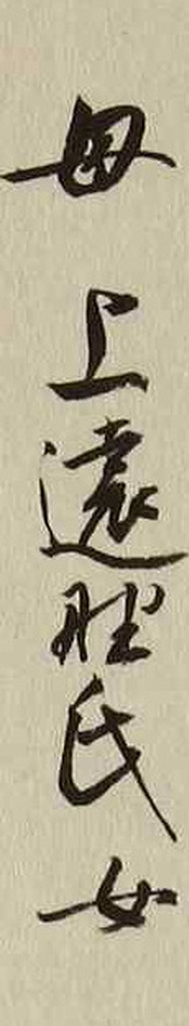母上遠野氏女
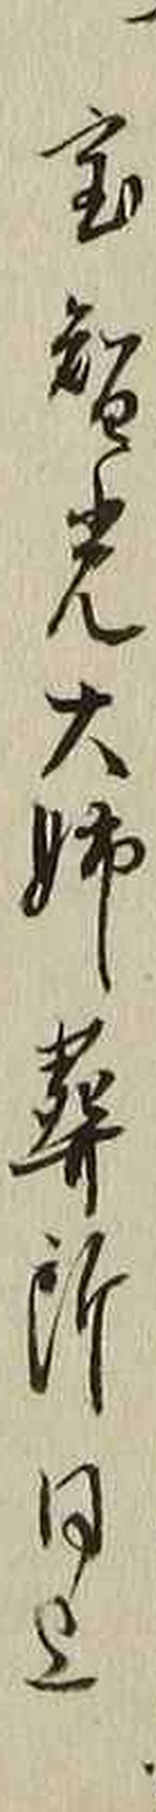宝智光大姉葬所同上
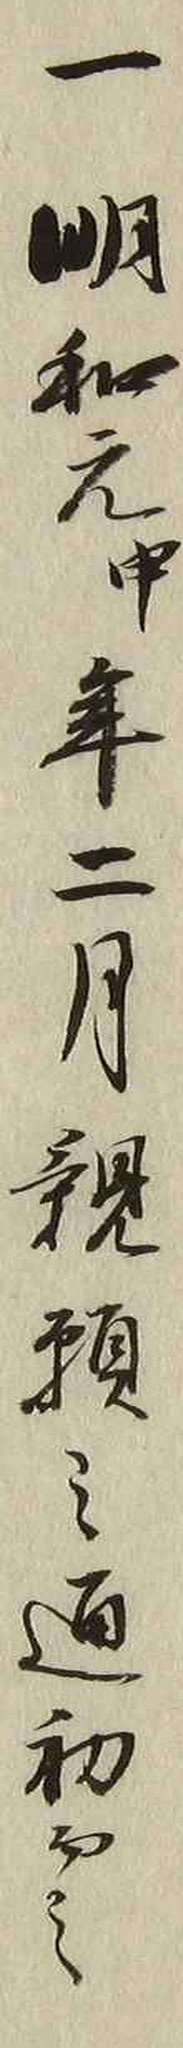一明和元申年二月親願之通初而之
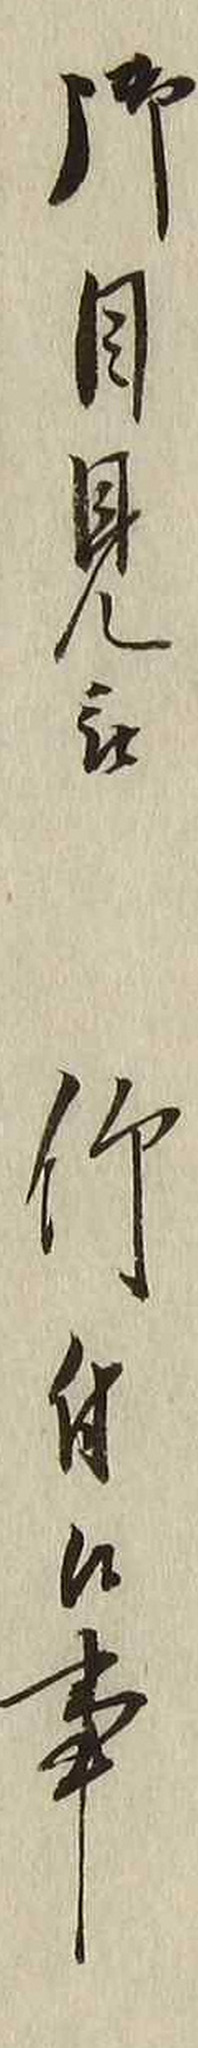御目見被仰付候事
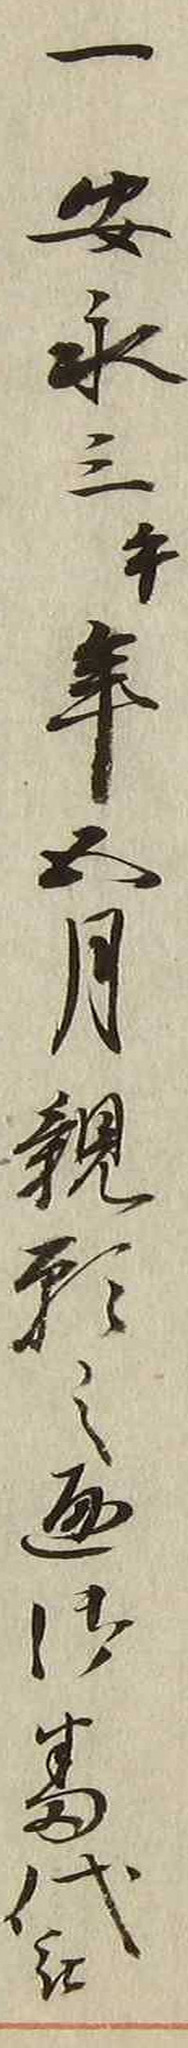一安永三午年五月親願之通御番代被
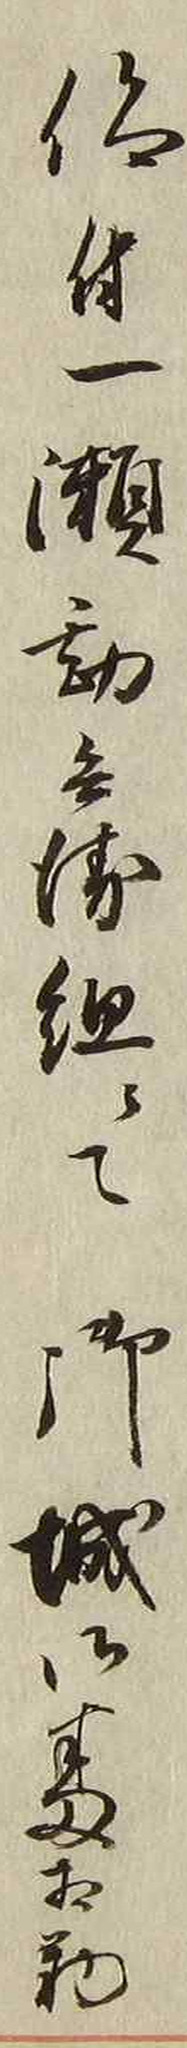仰付一瀬勘兵衛組ニて御城御番相勤
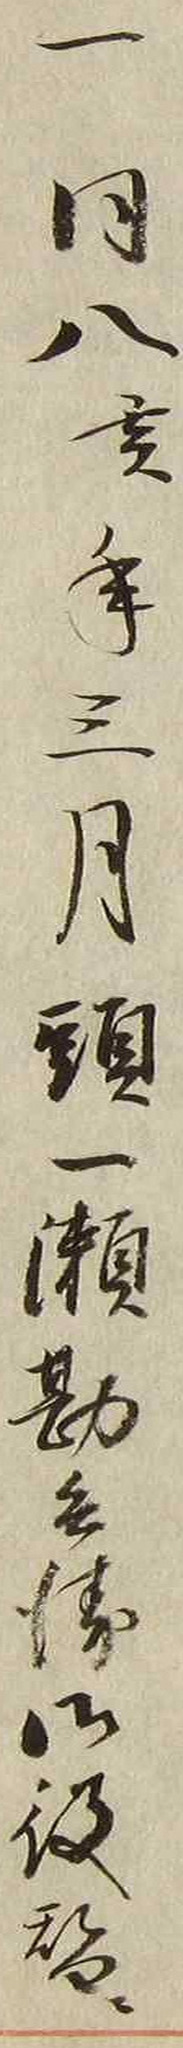一同八亥年三月頭一瀬勘兵衛御役替ニ
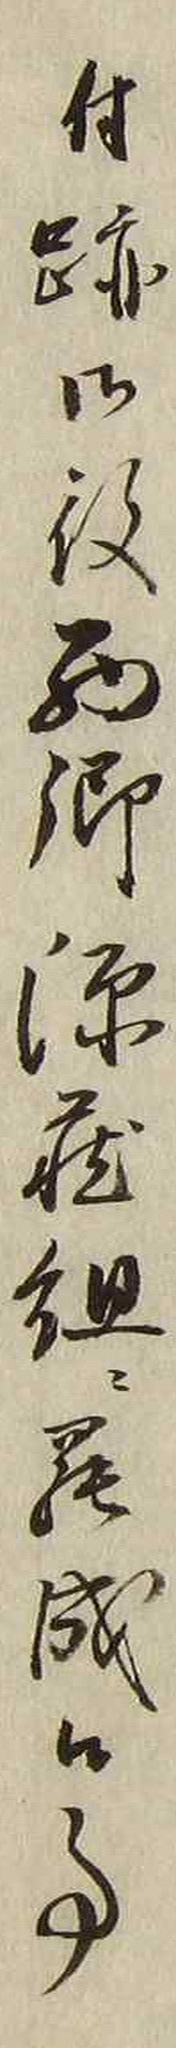付跡御役西郷源蔵組ニ罷成候事

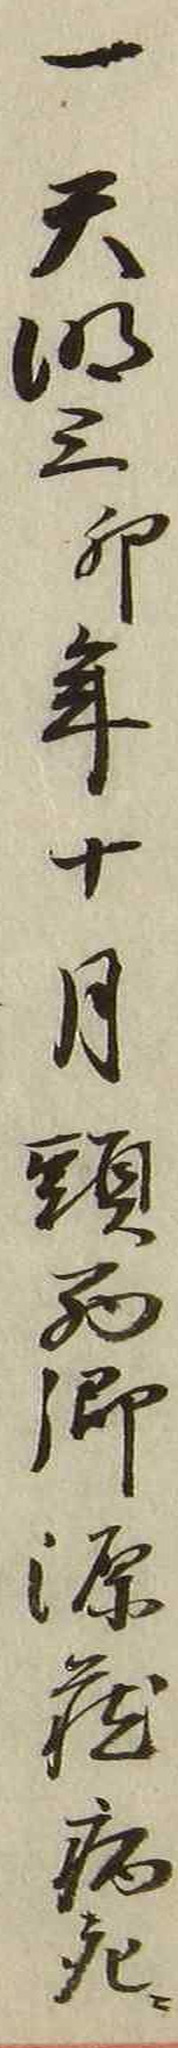一天明三卯年十月頭西郷源蔵病死ニ
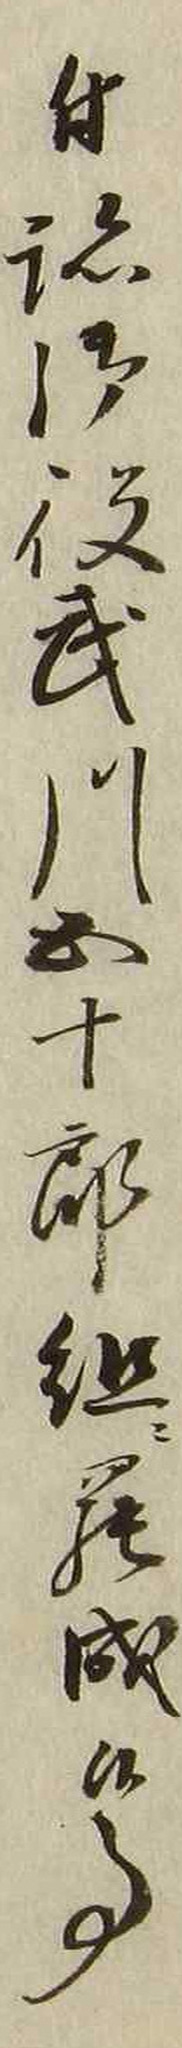付跡御役武川五十郎組ニ罷成候事
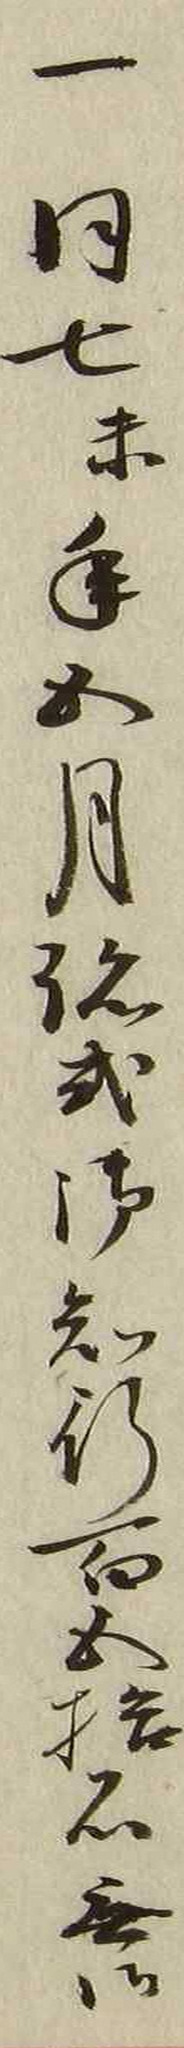一同七未年五月跡式御知行百五拾石無御
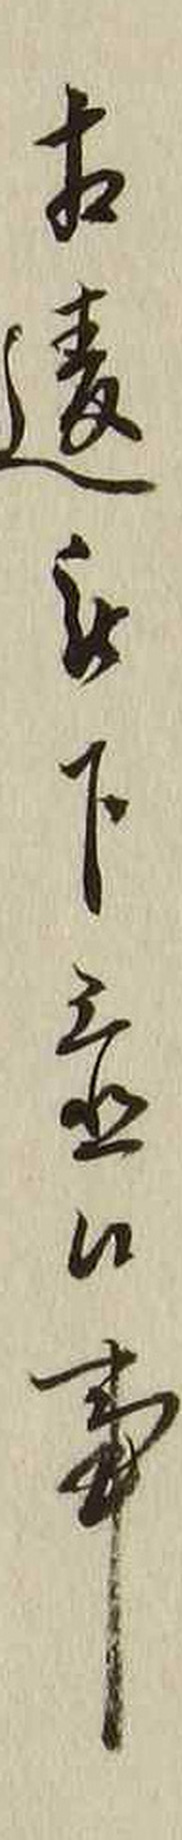相違被下置候事
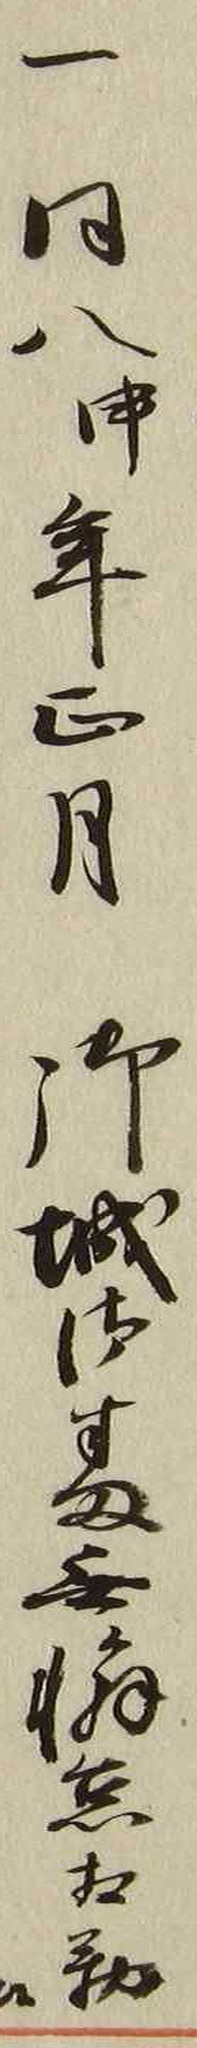一同八申年正月御城御番無懈怠相勤候
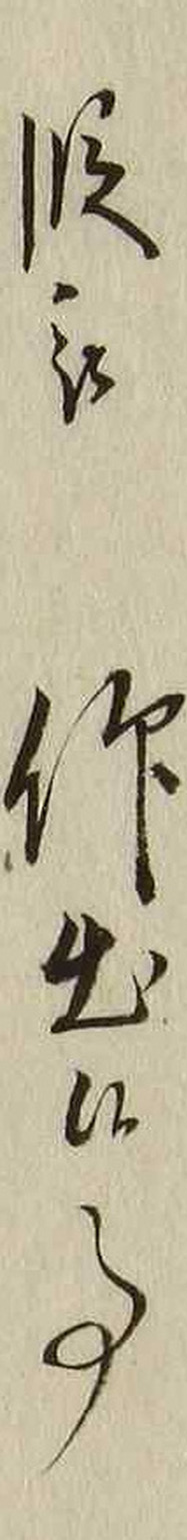段被仰出候事
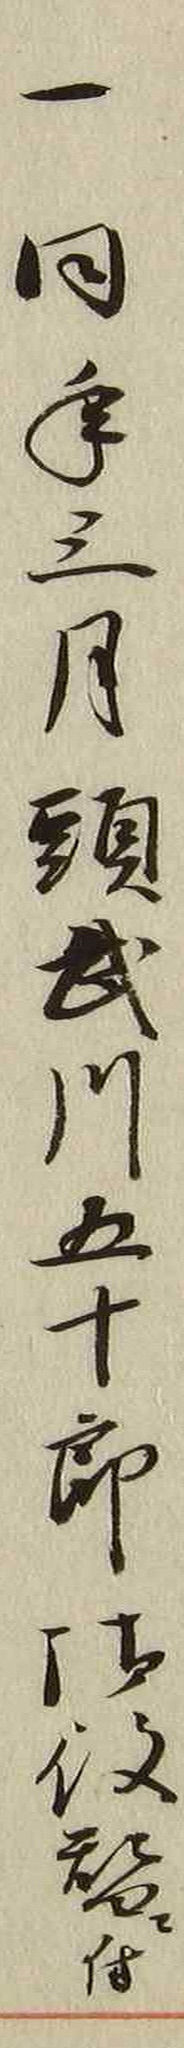一同年三月頭武川五十郎御役替ニ付
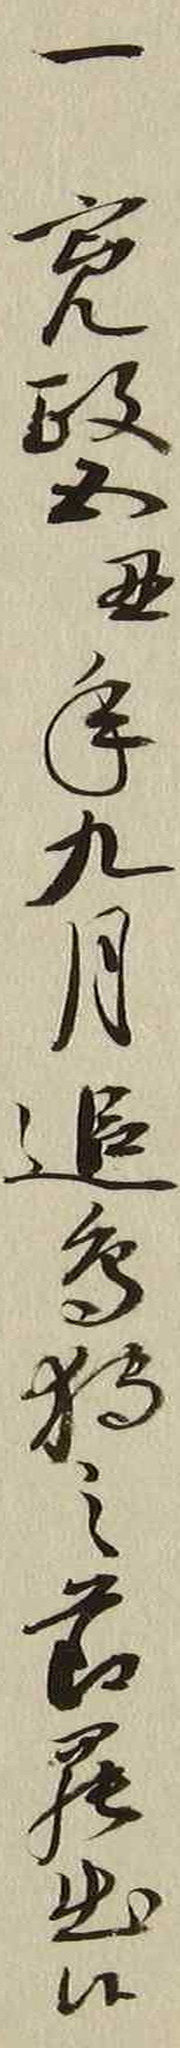一寛政五丑年九月追鳥狩之節罷出候
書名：諸士系譜　巻之22　い之部22
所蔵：会津若松市立会津図書館
